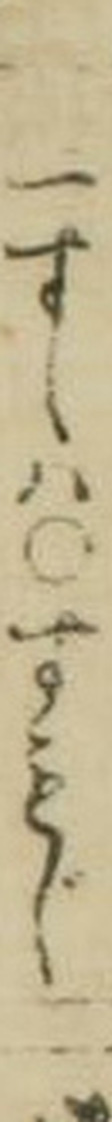一すしは○すもじ
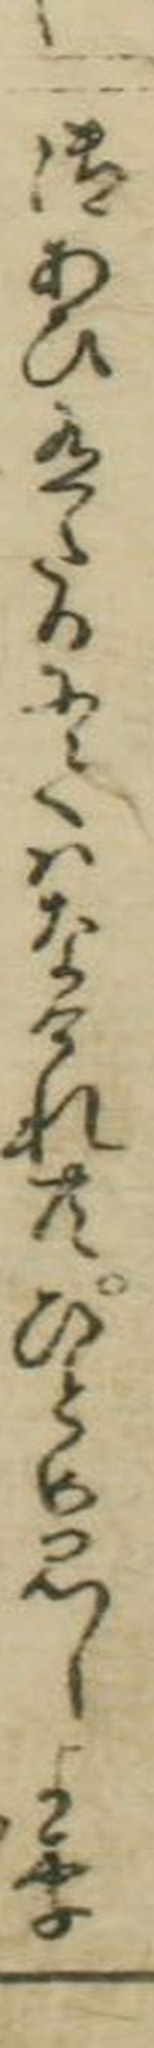御あひ有たるにてはなけれ共。ひとめ見しより
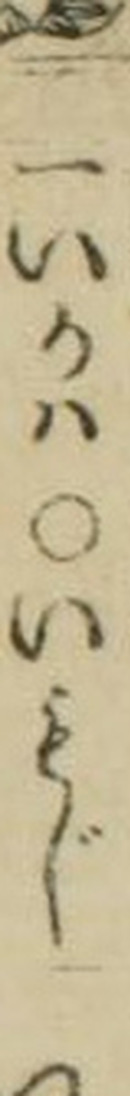一いかは○いもじ
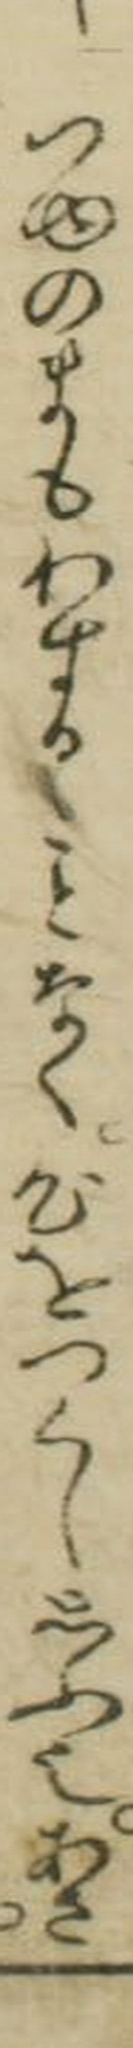つゆのまもわするゝことなく。心をつくし思ふ也。あさ
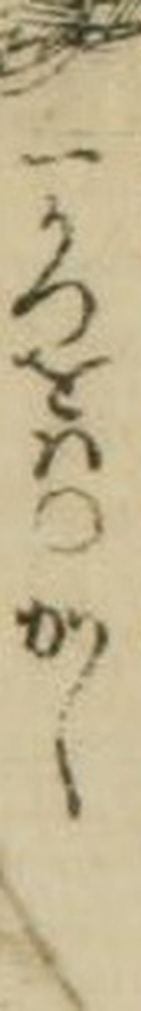一かつをは○かゝ
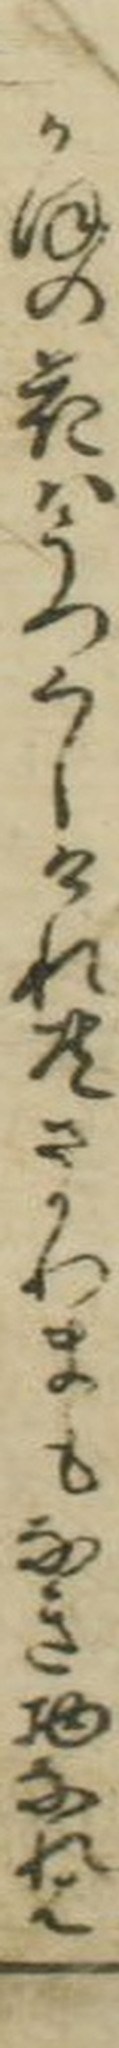かほの花はうつくしけれ共さかりまもなき物なれは。
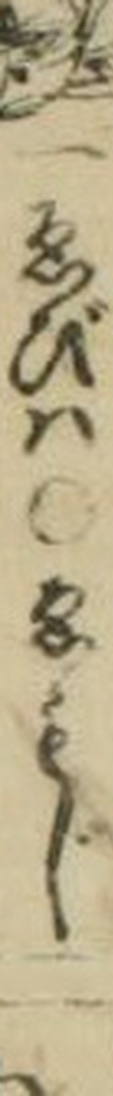一ゑびは○ゑもじ
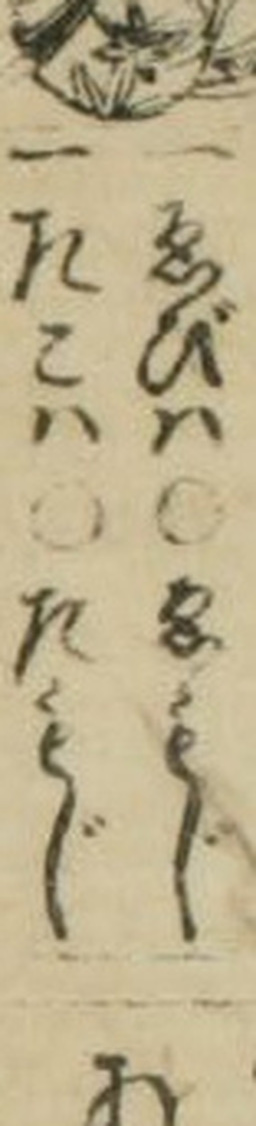一たこは○たもじ
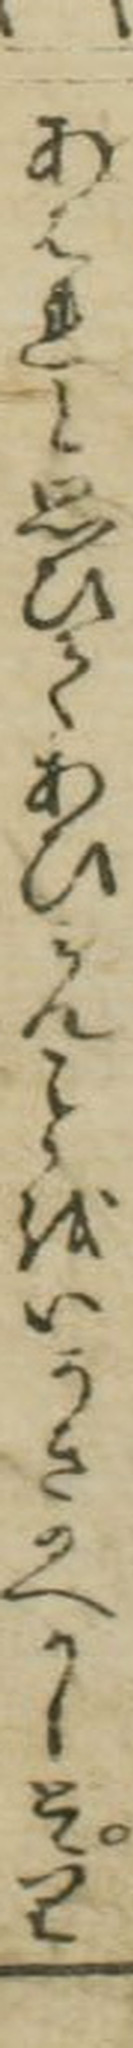あはれと思ひてあひみんことをいそき給へかしと。ゝり
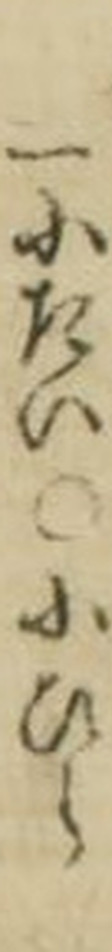一小たい○小ひら
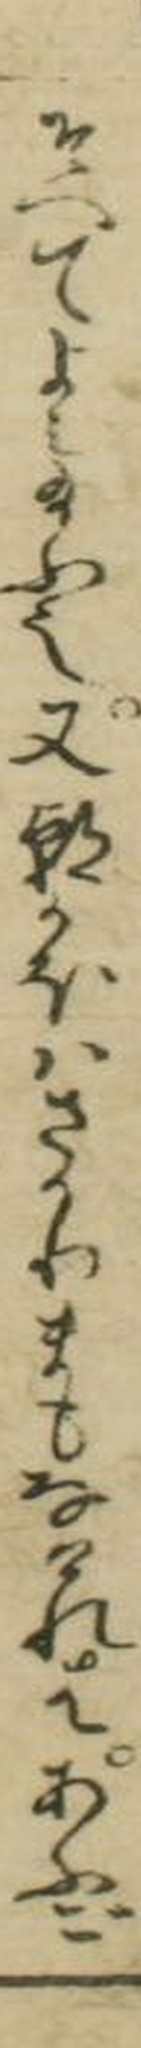そへてよみ給ふ也。又朝かほはさかりまもなけれは。あふご
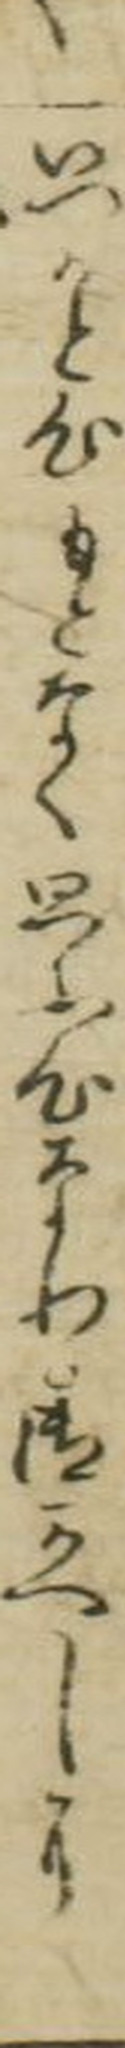いつかと心もとなく思ふ心なり○御かへしに
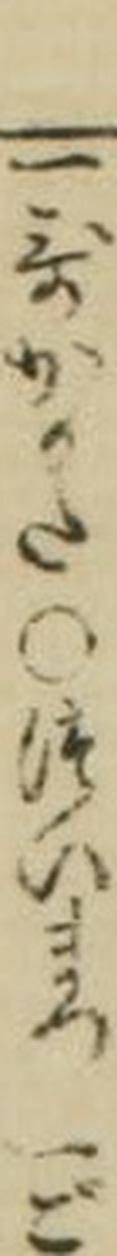一哥かるた○ついまつ
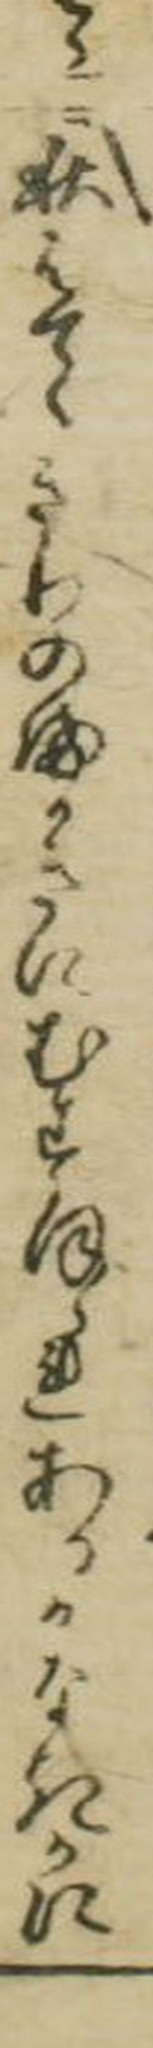〽秋はてゝきりのまかきにむすほゝれあるかなきかに
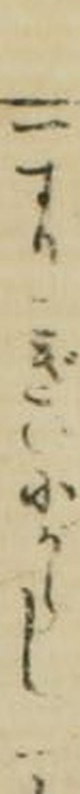一すりこぎ○小がらし
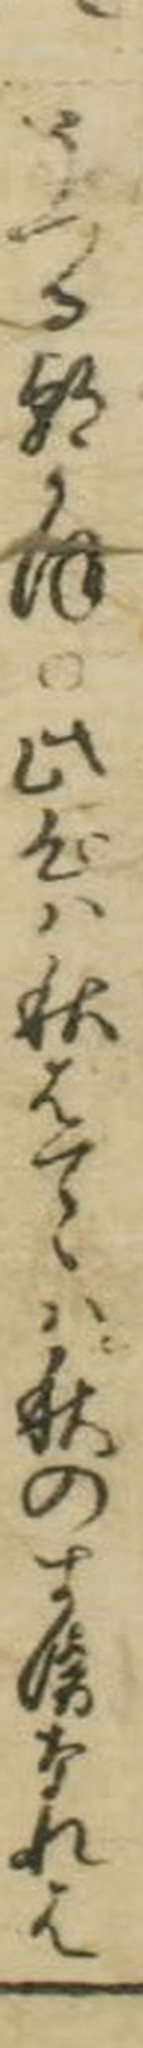うつる朝かほ○此心は秋はてゝは。秋のすゑなれは
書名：女源氏教訓鑑
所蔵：東京学芸大学附属図書館
